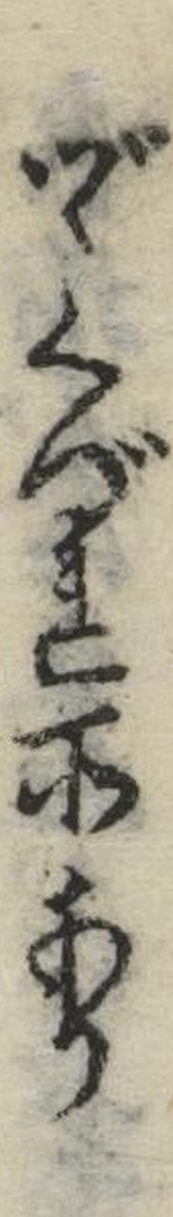ヅゝくづれ所あり
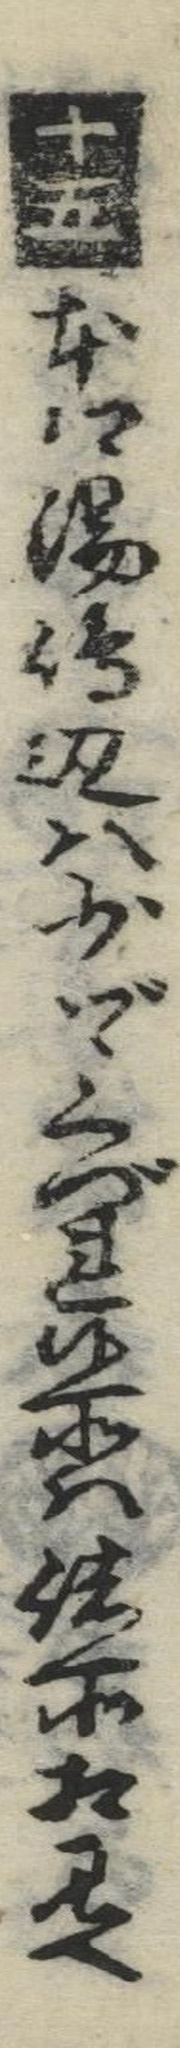十五本郷湯嶋辺ハ少ヅゝくづれ候所ハ諸所相見へ
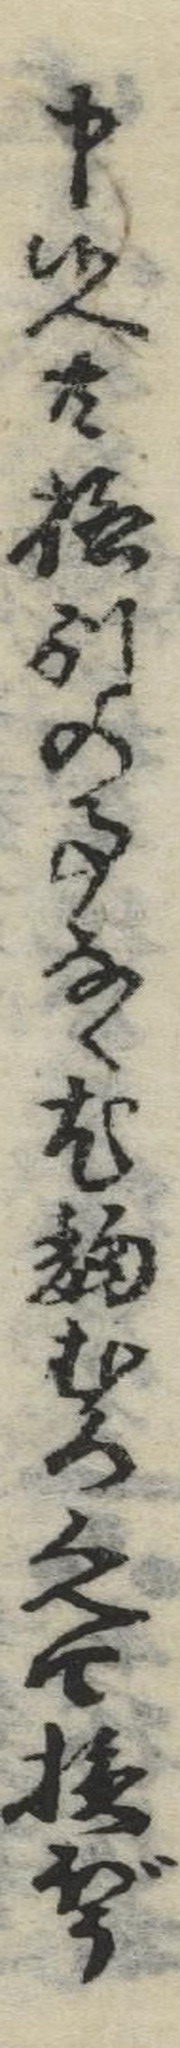申候へ共格別の事なく尤麹むろくへて損ぼう
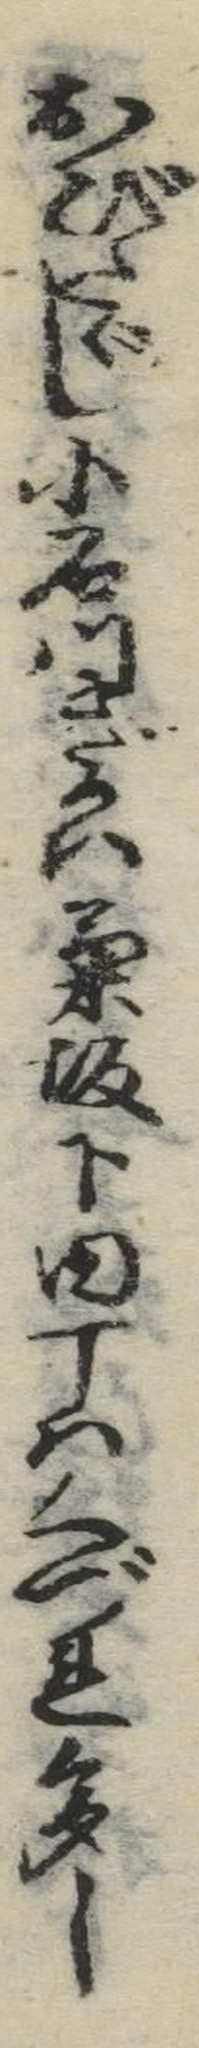おびたゞし小石川かたかハ菊坂下田丁ハくづれ多し
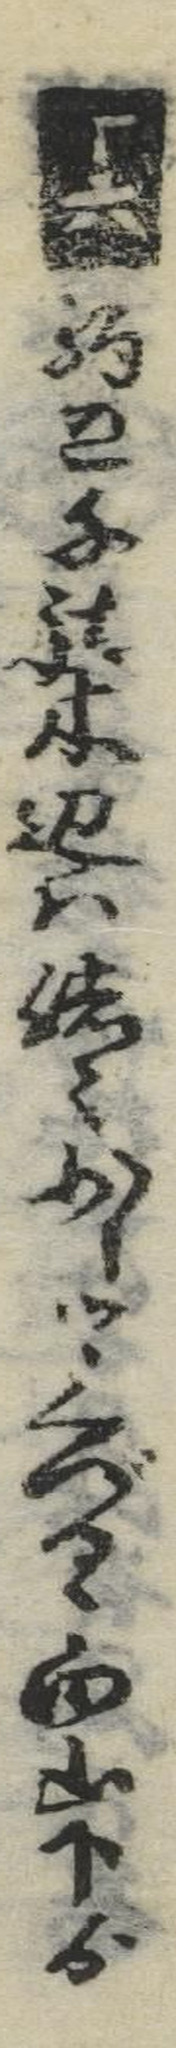十六駒込千駄木辺ハ諸々少しつゝくづれ白山下ゟ
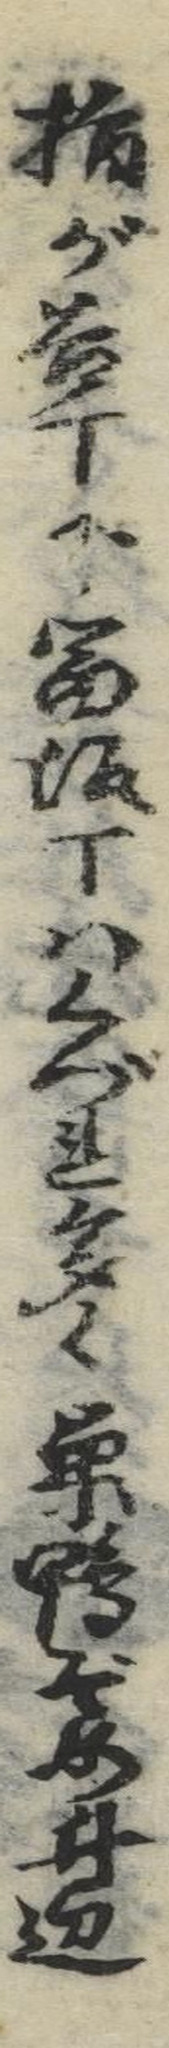指が谷丁下富坂丁ハくづれ多く巣鴨そめ井辺
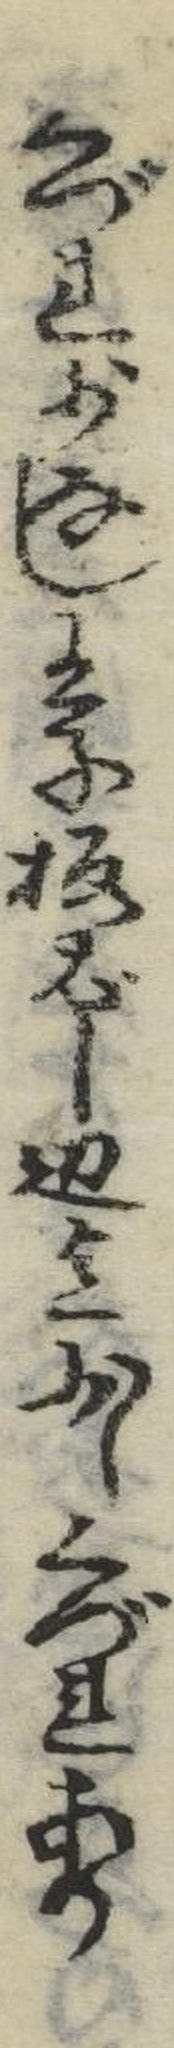くづれ少なし王子板ばし辺迄少しくづれあり
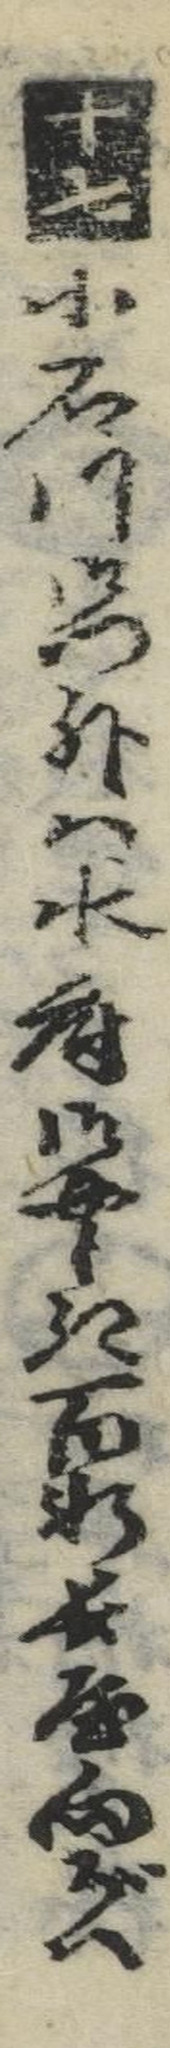十七小石川御門外ハ水府御やしき百軒長屋向がハ
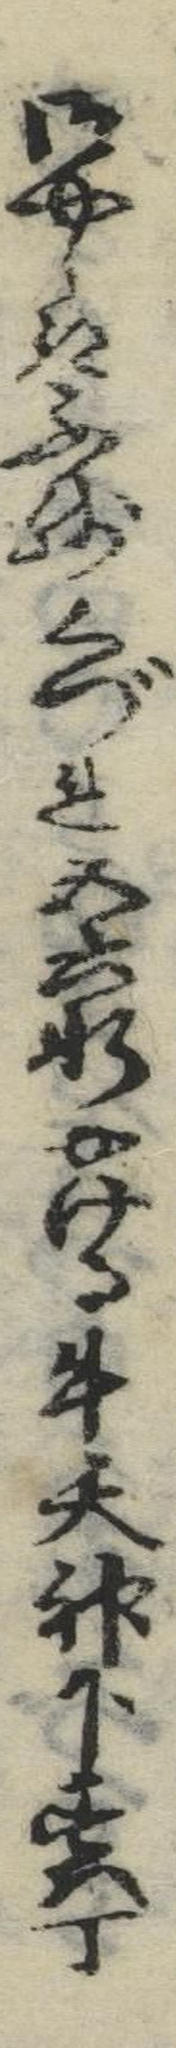御やしき不残くづれ五六軒やける牛天神下すハ丁
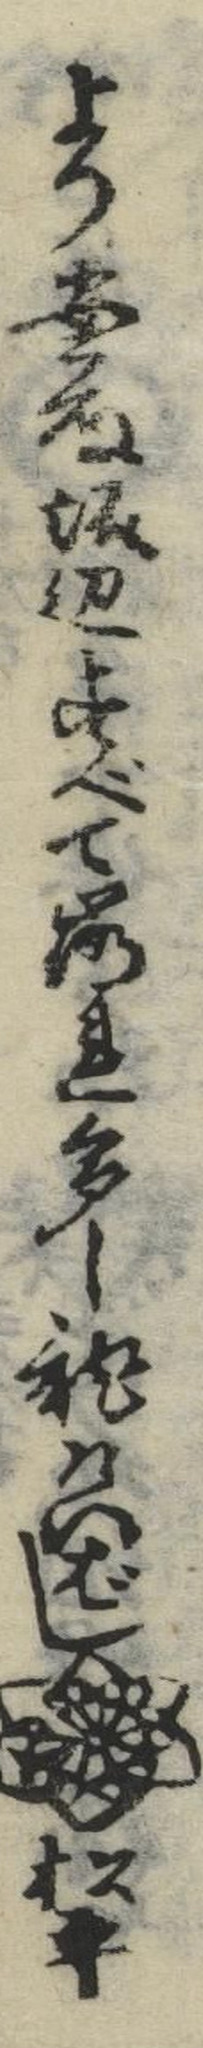より安藤坂辺すべて崩れ多し龍けいばし松平
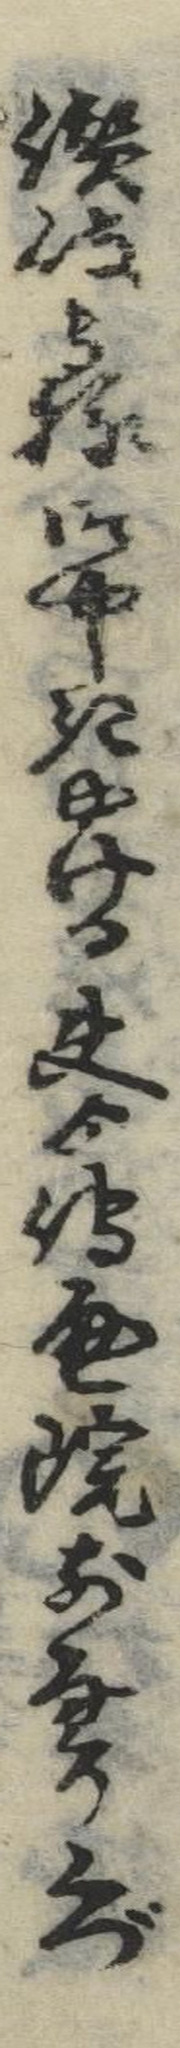讃岐守様御やしきやける夫ゟ伝通院前通りくづ
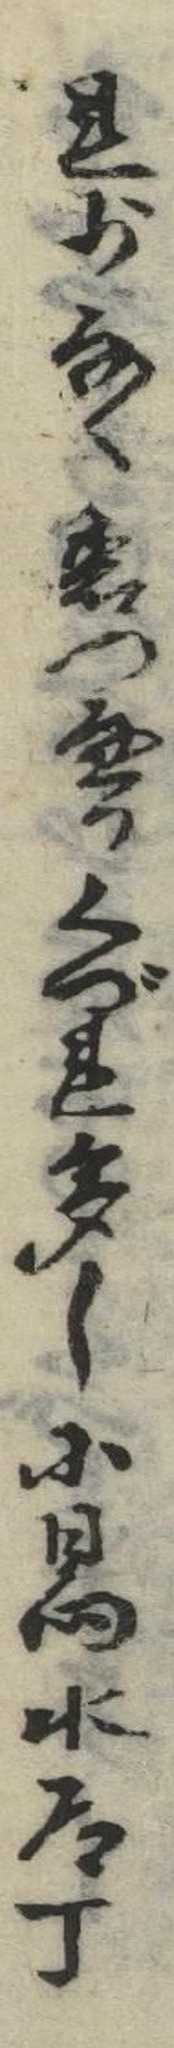れ少なく裏門通りくづれ多し小日向水道丁
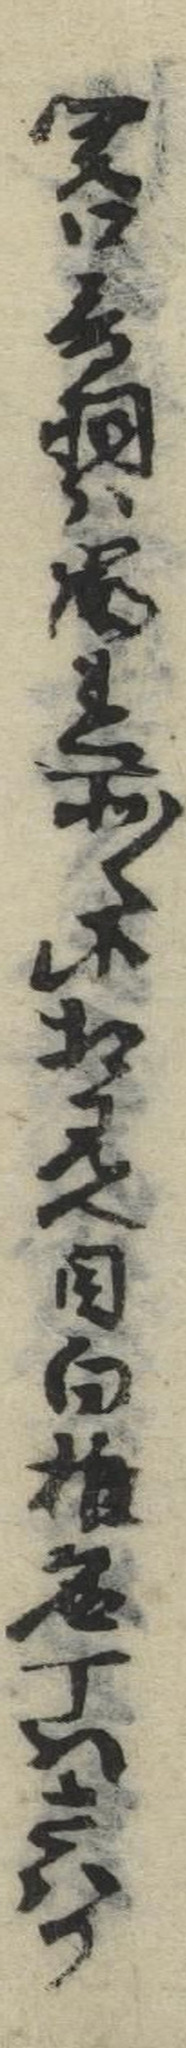関口青羽ハ崩れ所々候相見へ目白椎名丁ハさハり

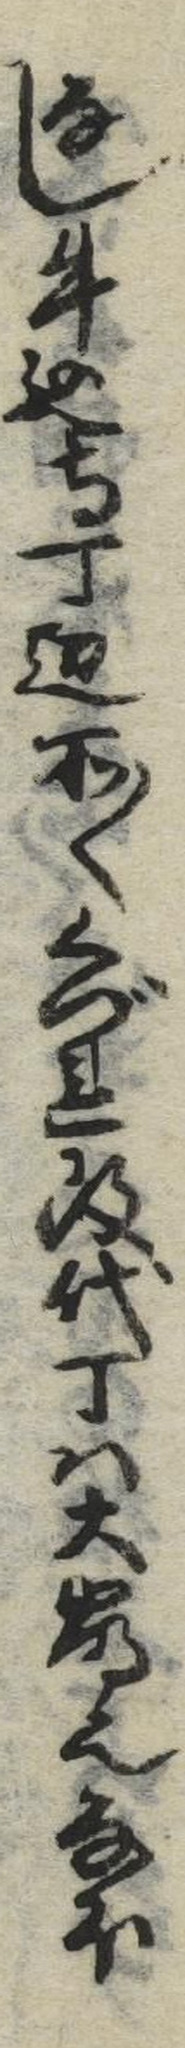なし牛込寺丁辺所々くづれ改代丁ハ大崩也なほ
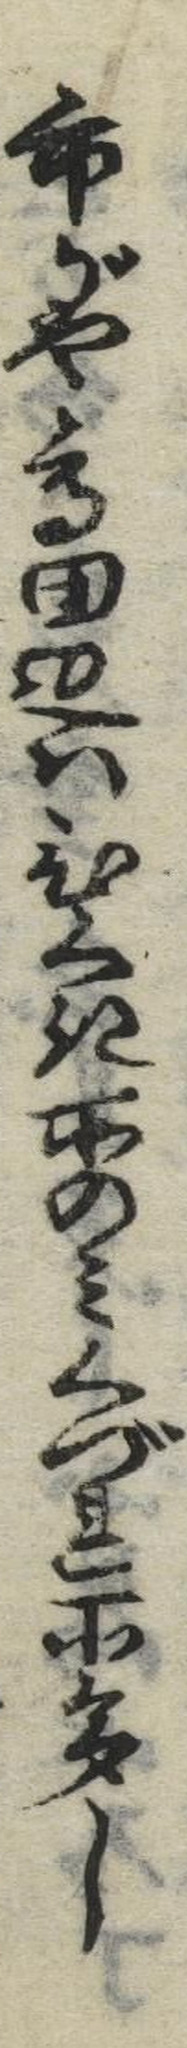市ヶ谷高田辺ハひくき所のミくづれ所多し
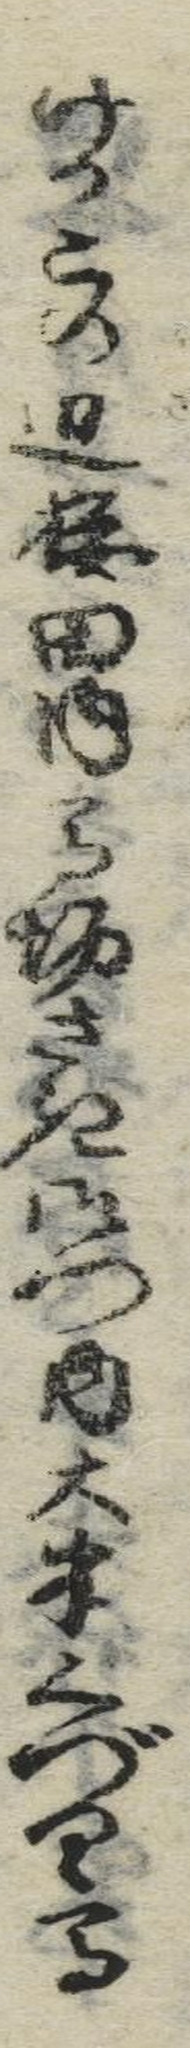けるこの辺桜田門馬場さき御門内大半くづるゝ馬
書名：安政二卯十月二日夜四ツ時過　御府内御屋敷方市中共　地震類焼場所明細書之寫　并街道筋近郷聞書
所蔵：東京大学地震研究所図書室 Earthquake Research Institute Library, The University of Tokyo, JAPAN
